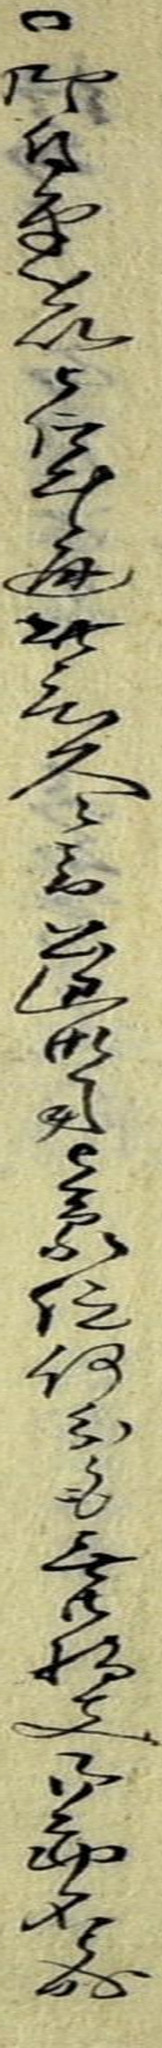○御自筆を以被仰出候通此度久々に而公辺御用被蒙仰何分にも無御指支御勤不被成
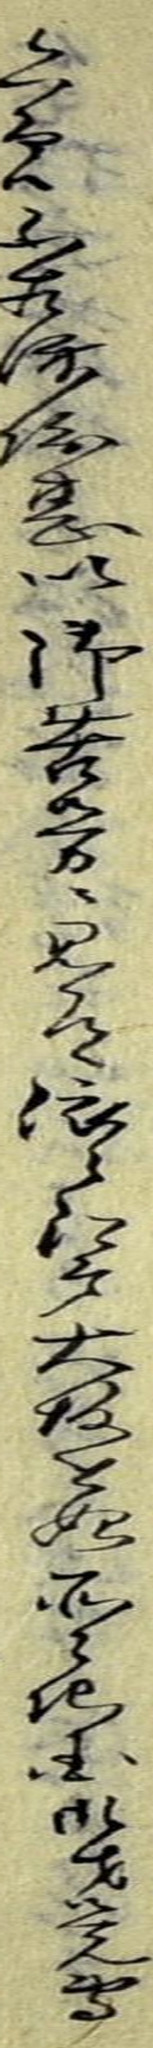下候而は不相済儀甚以御苦労に思召候依之江戸大坂を始所々他国御才覚専
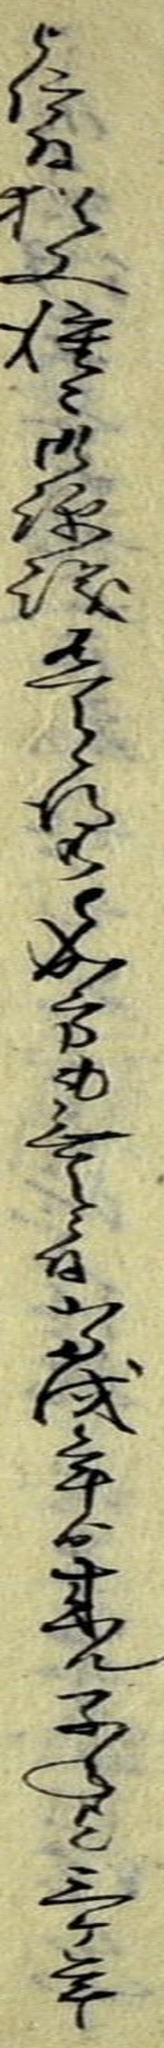被仰付猶又種々御評儀有之候得共被成方も無之候に付当戌年ゟ来ル子年迄三ヶ年
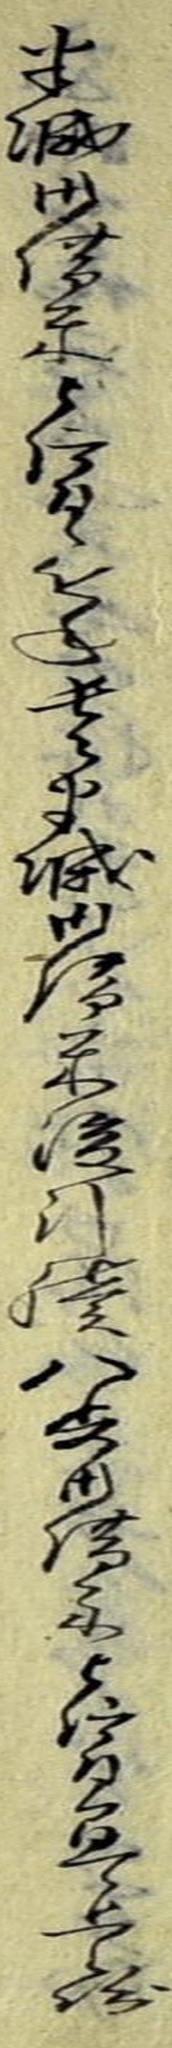半減御借米被仰付候近年長々半減御借米後引続八歩御借米被仰付置候上之儀

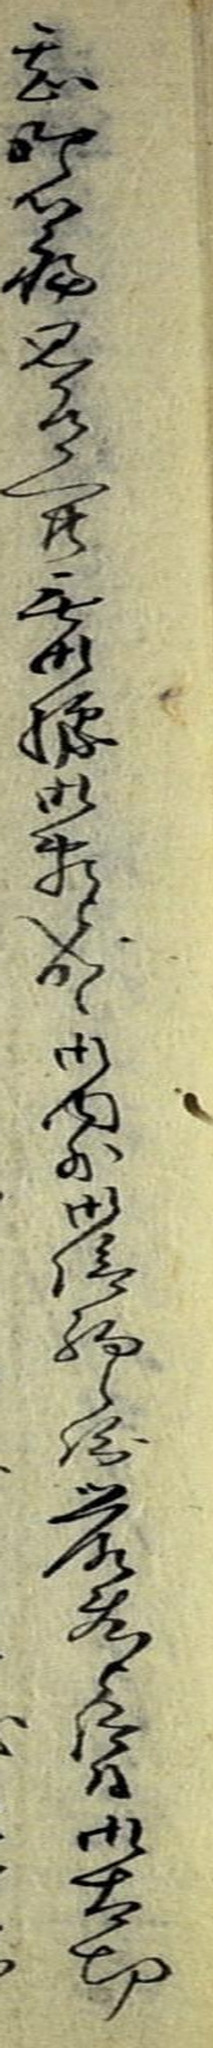甚御心痛思召候へ共無御拠御頼被成候御内外御倹約之儀厳敷被仰付御太切
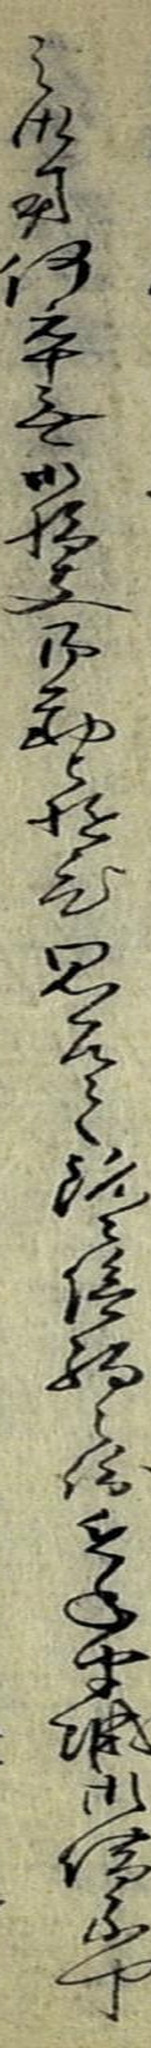之御用何卒無御指支御勤被遊度思召ニ候銘々倹約之儀近年半減御借米中
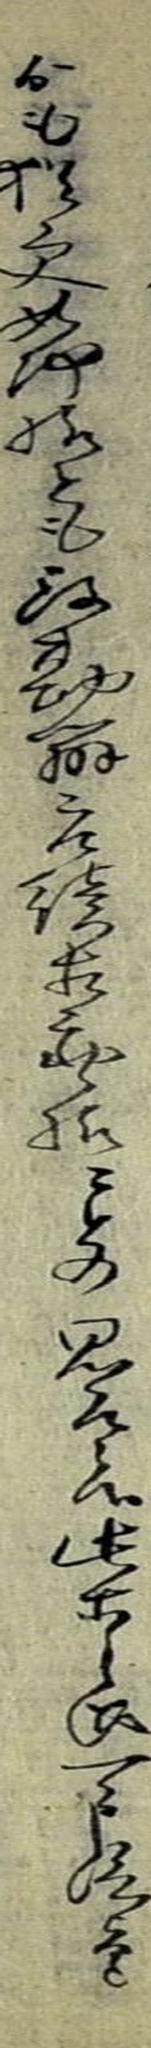ゟも猶更如何様とも致勘弁取続相勤候様にとの思召に候此等之趣可申渡旨被
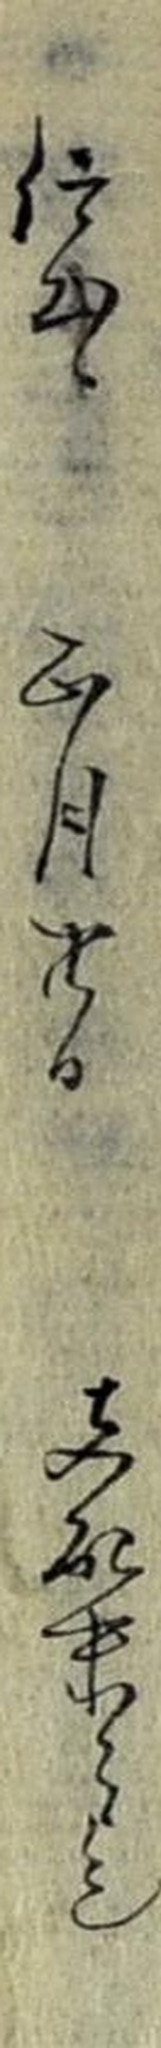仰出候正月廿日支配末々迄
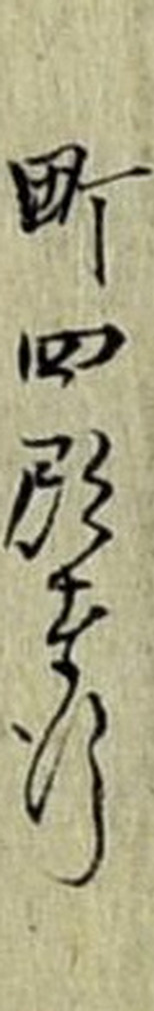町四郡奉行
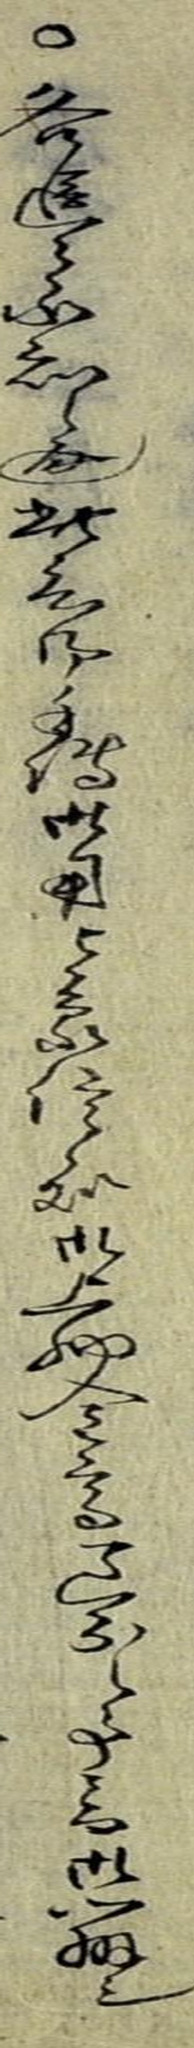○各追々承知之通此度御手伝御用被蒙仰候処御上納金高過分之事に而御弁し
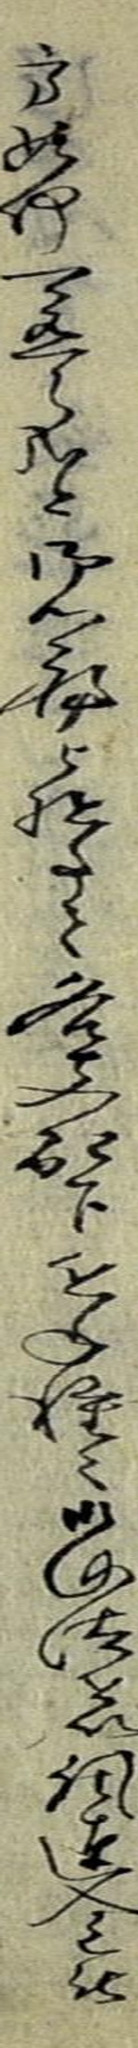方如何可有之候哉と御心痛被遊事に候各支配下近年種々御趣法を以調達金被
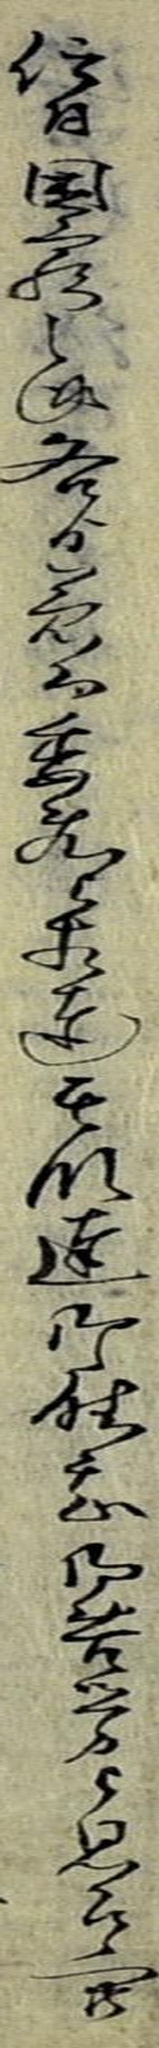仰付困窮之趣各ゟ兼而委敷被相達其段達御聴甚御苦労被思召候へ共
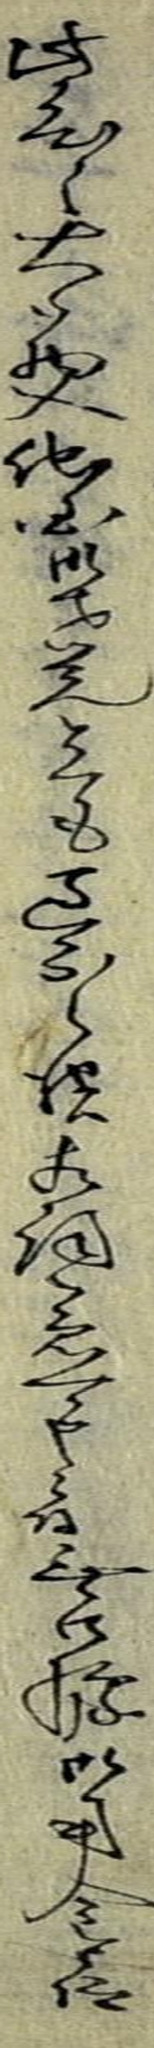此度之大御物入他国御才覚とても過分之儀は相調兼可申に付無御拠御用金被仰
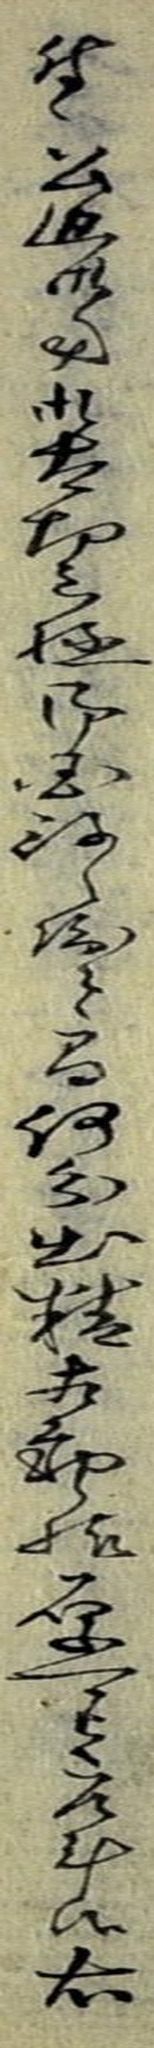付候公辺御用御太切至極御国役之儀に候間何分出精相勤候様厚可被取斗候右
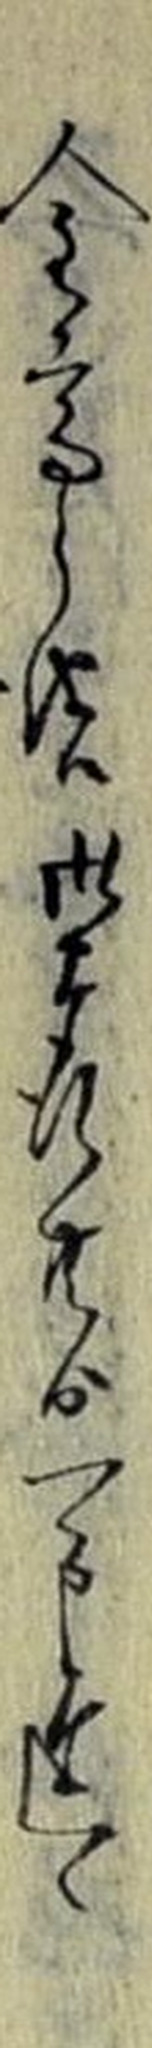金高之儀は御奉行共ゟ可申達候
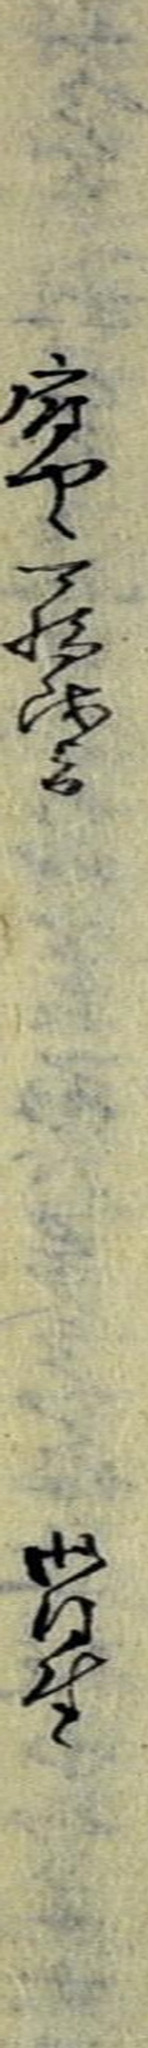府中へ可指越旨御目付
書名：命令之部 四
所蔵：福井県文書館 Fukui Prefectural Archives
